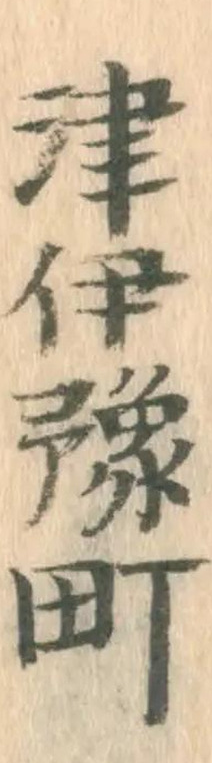津伊豫町
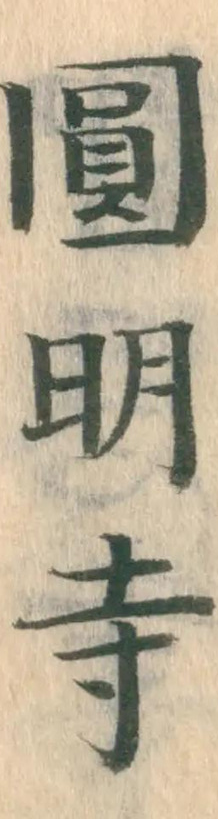圓明寺
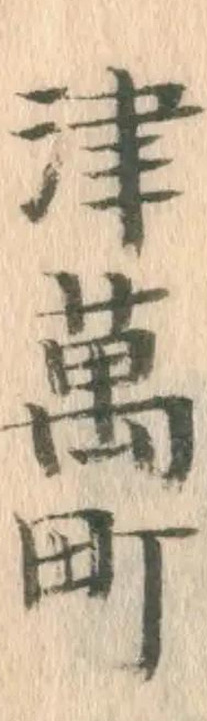津萬町
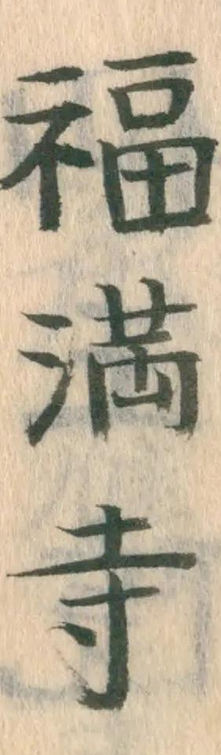福満寺
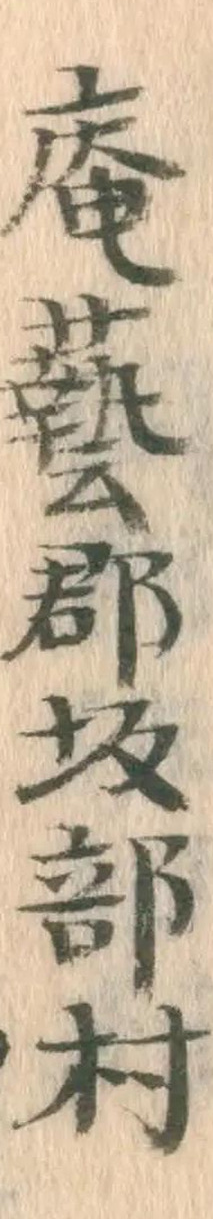庵芸郡坂部村
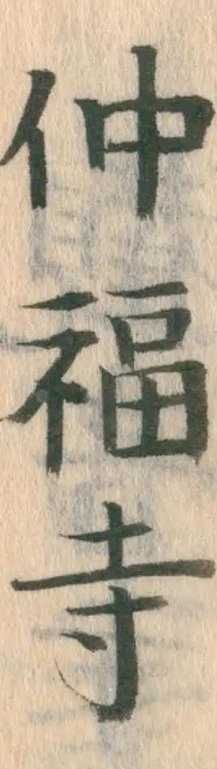仲福寺
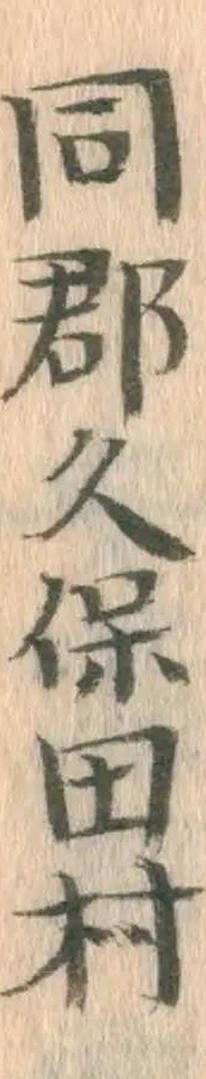同郡久保田村
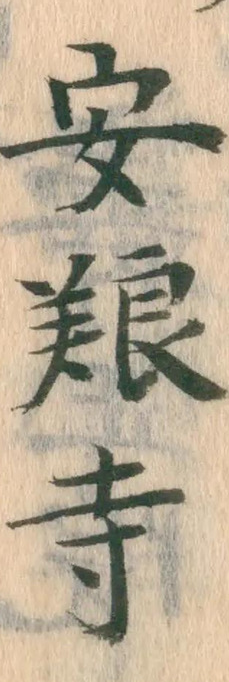安羪寺
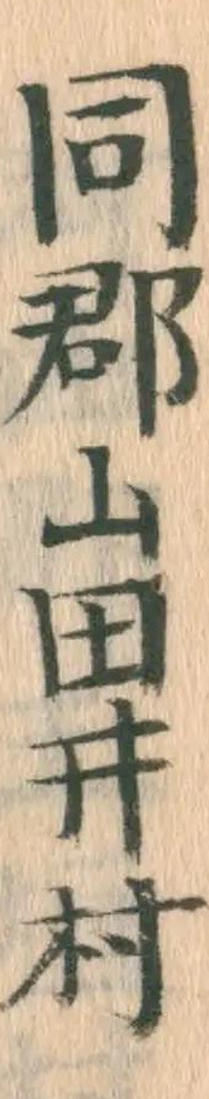同郡山田村
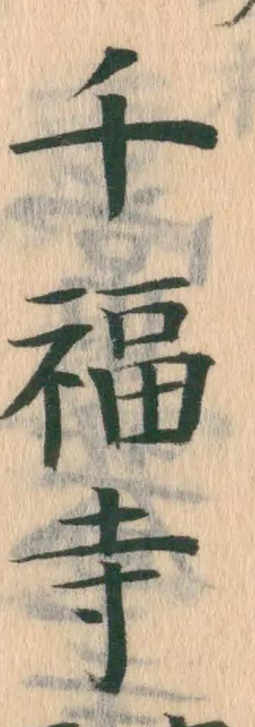仲福寺
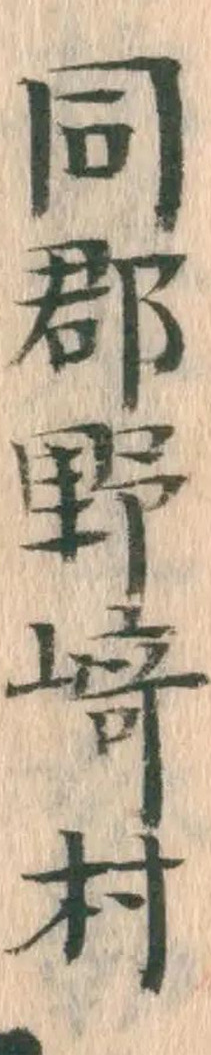同郡野崎村
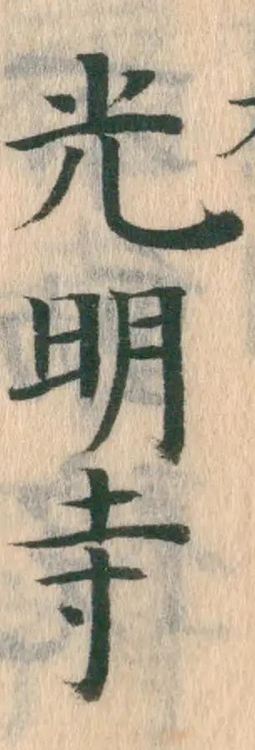光明寺
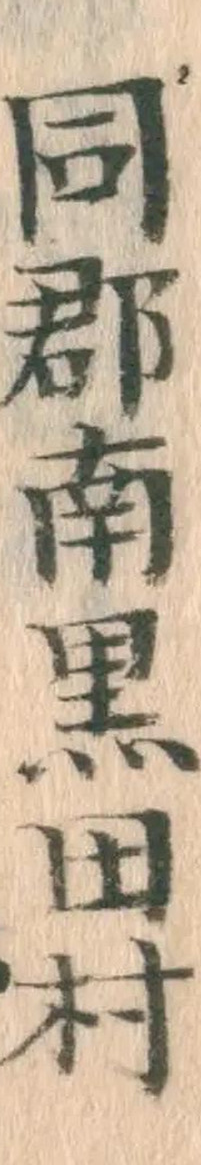同郡黒田村
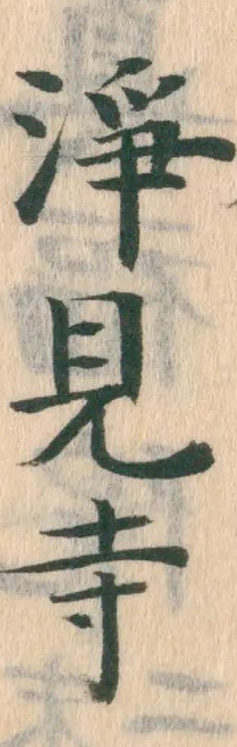淨見寺
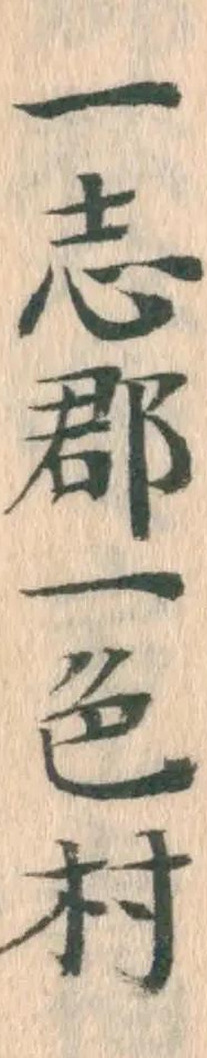一志郡一色村
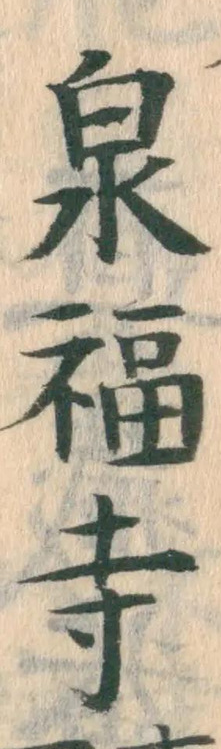仲福寺
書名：古義真言宗本末帳 21巻. [4] 第三 伊賀国、伊勢国、志摩国、尾張国、三河国、遠江国、駿河国、伊豆国、甲斐国
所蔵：国立国会図書館 National Diet Library, JAPAN
